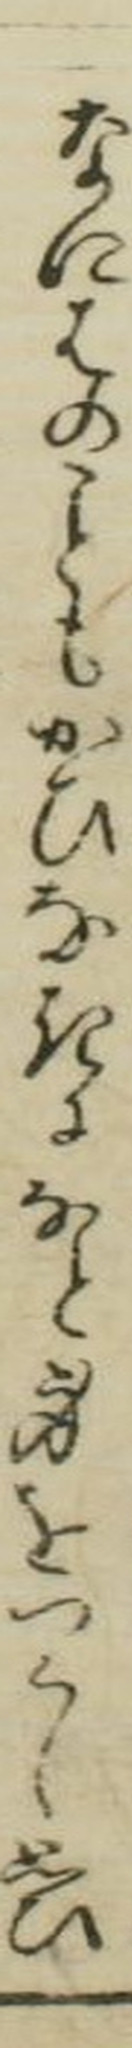なにはのこともかひなきになと身をつくし思ひ
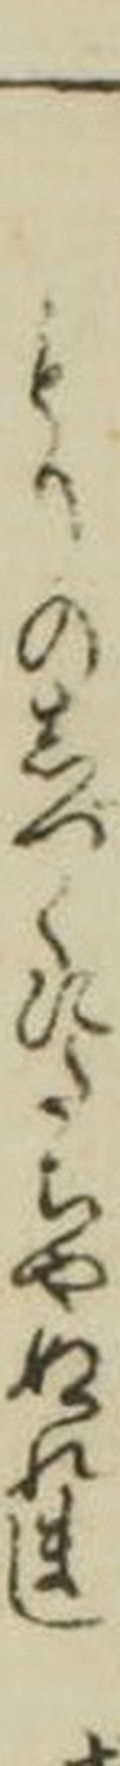もりのしづくにたちやぬれまし式部
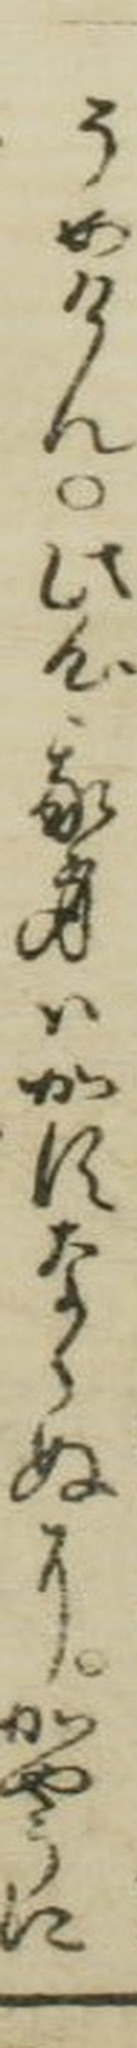そめけん○此心我身はかすならぬに。かやうに
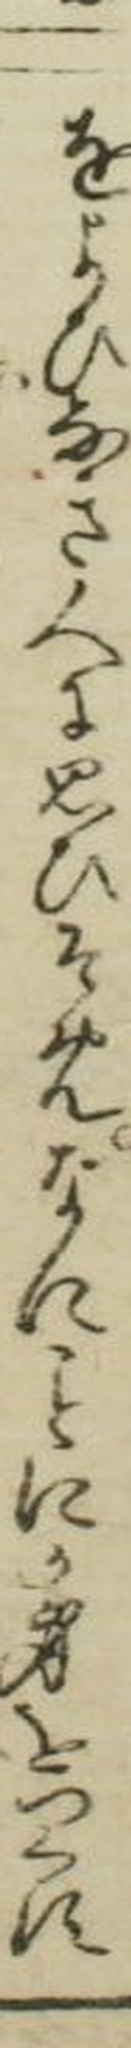をよひなき人に思ひそめ。なにことにか身をつくす
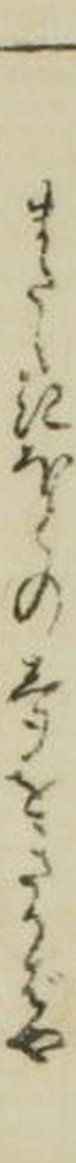またしきほとの声をきかばや
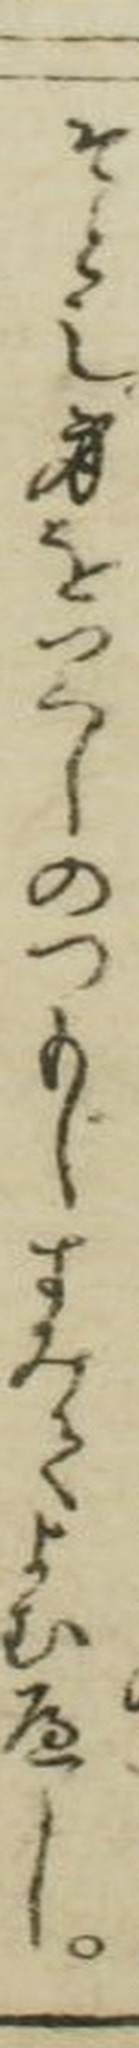そと也。身をつくしのつもじすみてよむへし。
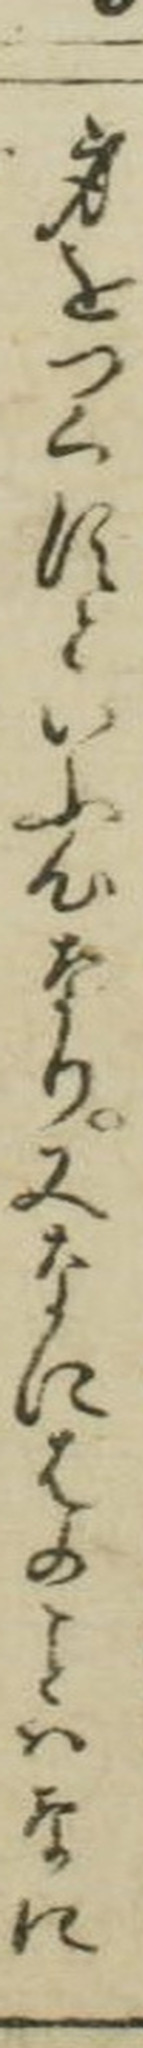身をつくすといふ心なり。又なにはのことはなに
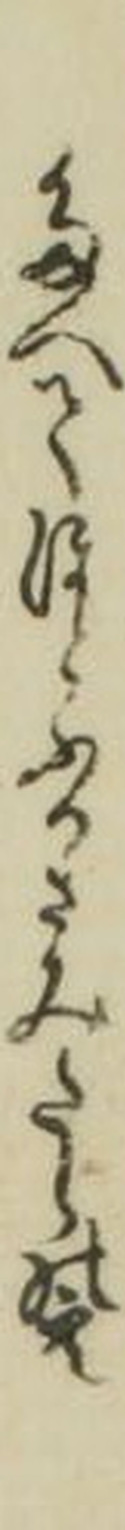たへてほとふるさみたれの空
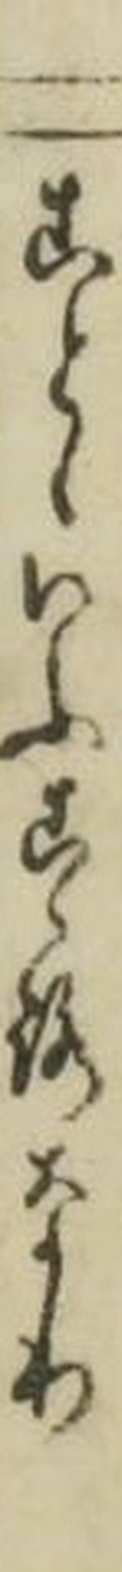ことゝいふこゝろなり
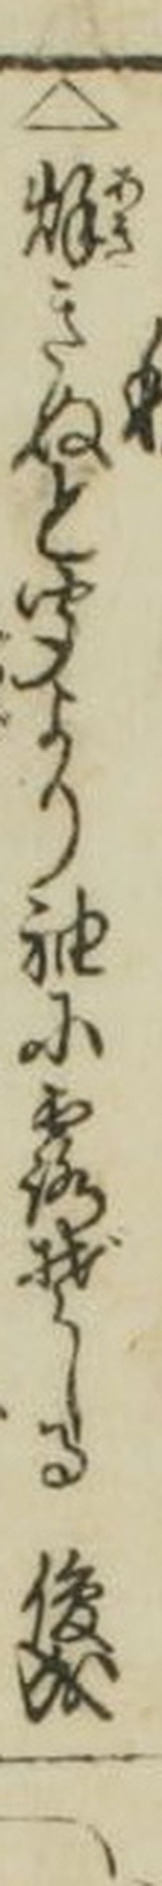△秋きぬと聞より袖に露ぞしる俊成
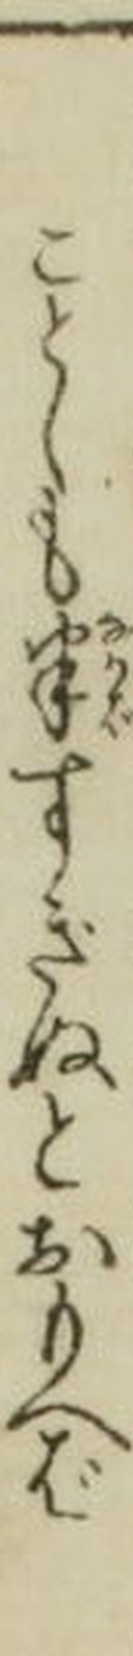ことしも半すぎぬとおもへば
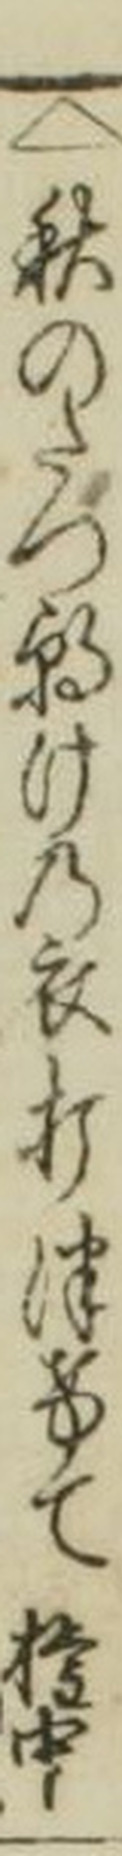△秋のたつ朝けの衣打つけて権中
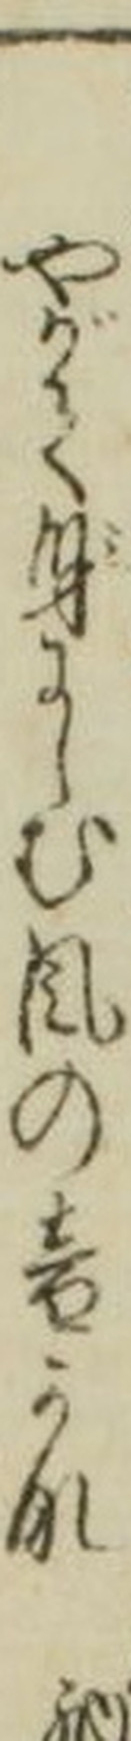やがて身にしむ風の音かな納言
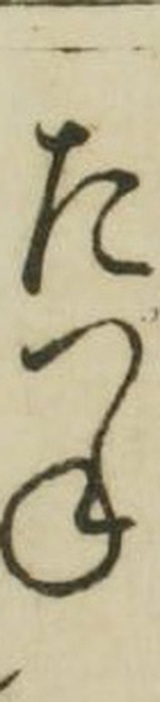たづね
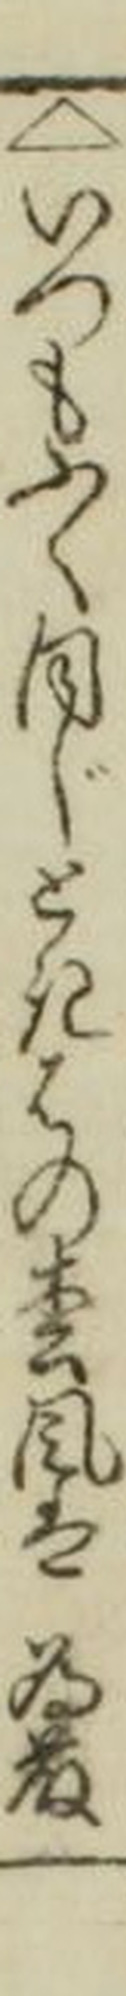△いつもふく同じときはの松風は為藤
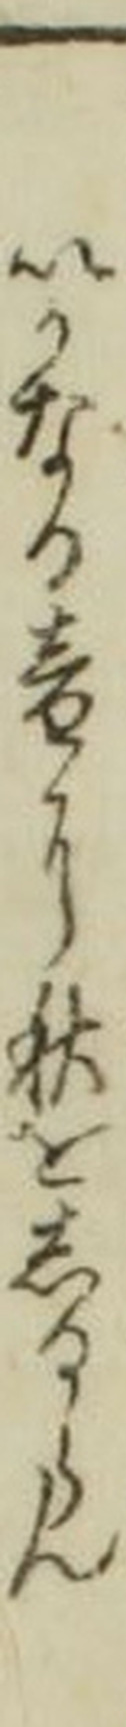いかなる音に秋をしるらん
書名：女源氏教訓鑑
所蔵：東京学芸大学附属図書館
